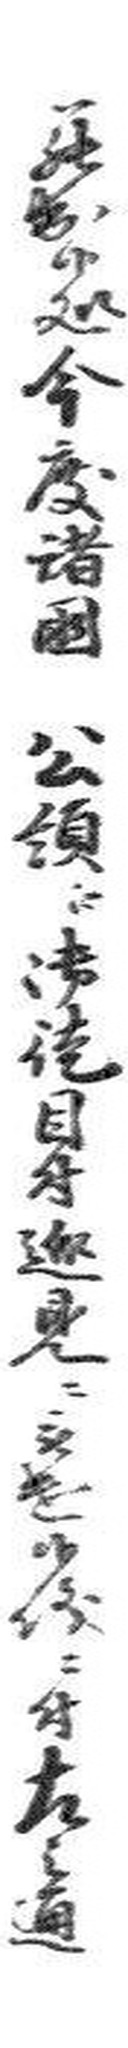罷出候処今度諸国公領江御徒目付巡見ニ被遣候儀ニ付左之通
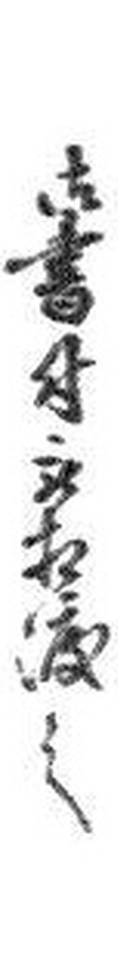御書付被相渡之
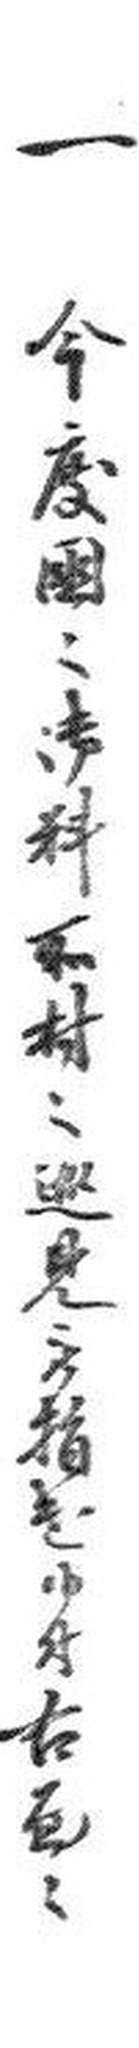一今度国々御料所村々巡見被指遣候付右面々
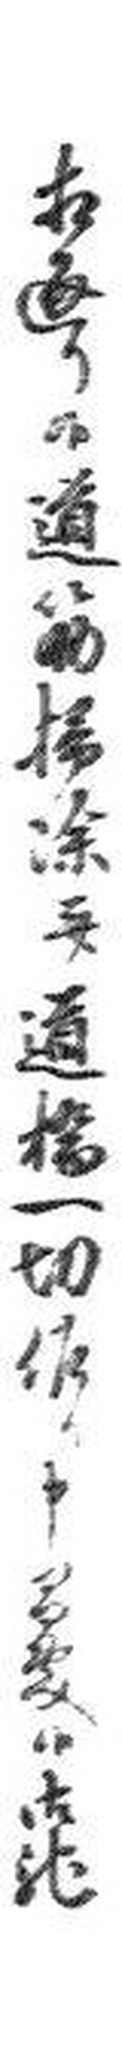相通り候道筋掃除并道橋一切佐ケ申間敷候御
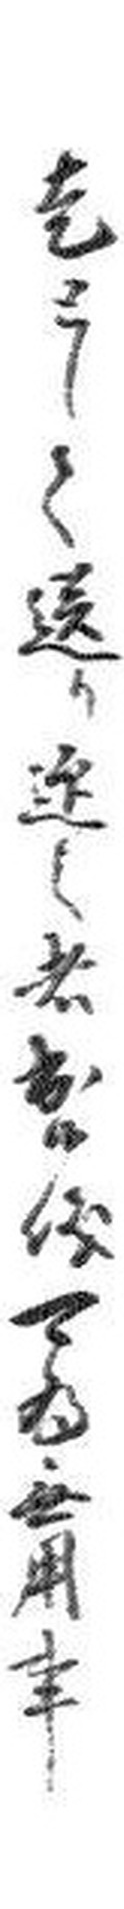走として送り迎之者出候儀可為無用事
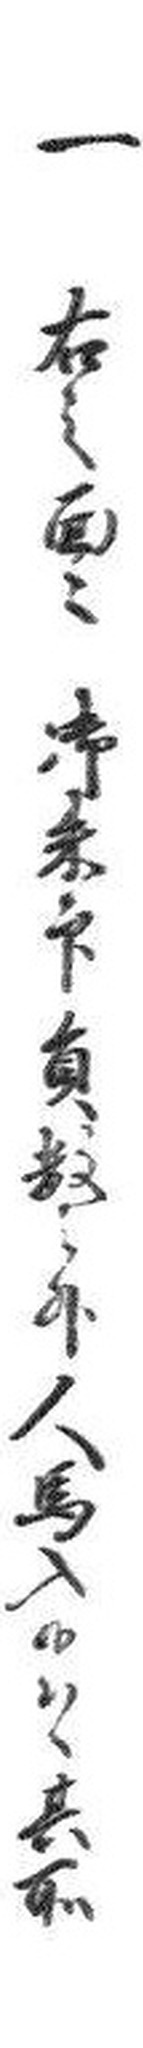一右之面々御朱印員数之外人馬入候ハゝ其所
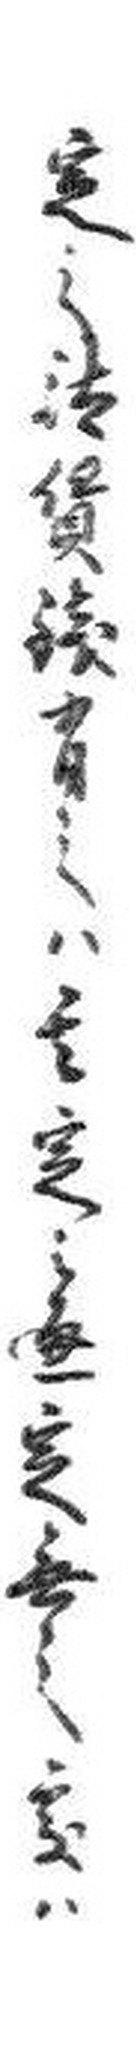定之諸賃銭有之ハ其定之通無之処ハ

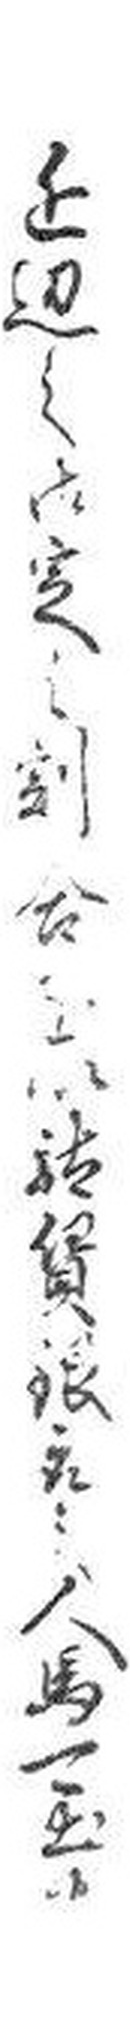近辺之御定之割合を以駄賃銀取之人馬可出候
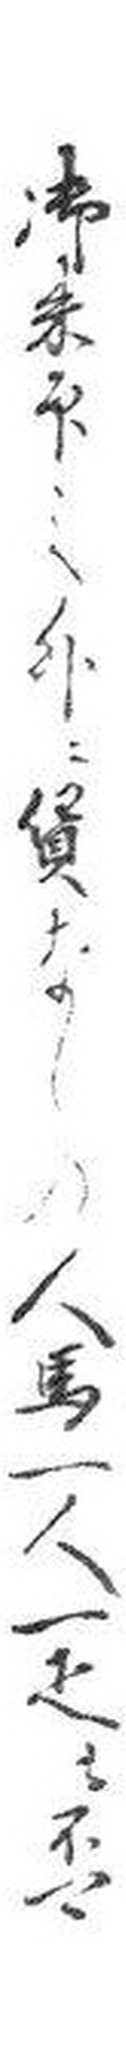御朱印之外ニ賃なしの人馬一人一疋も不可
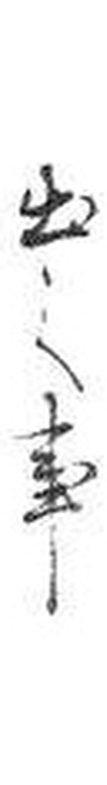出之事
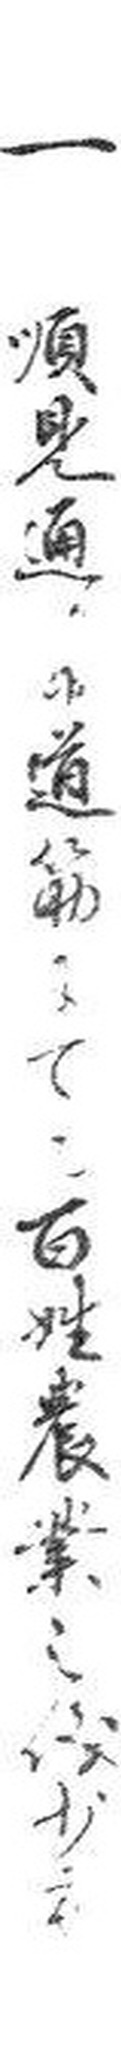一順見通り候道筋にても百姓農業之儀少も
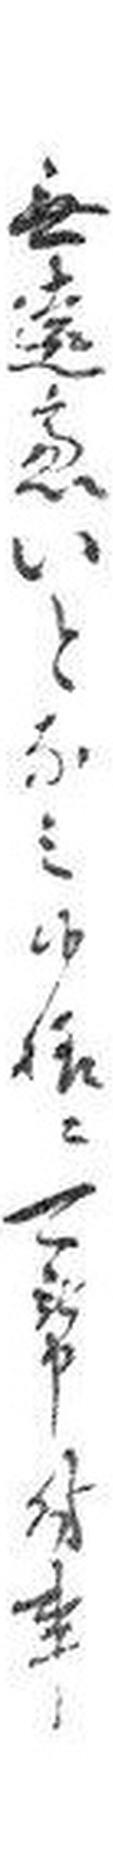無遠慮いとなみ候様ニ可被申付事
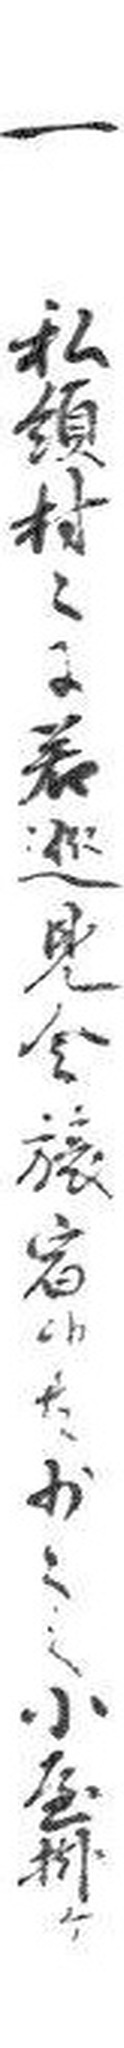一私領村々に若巡見舎旅宿候共少々之小屋掛ケ
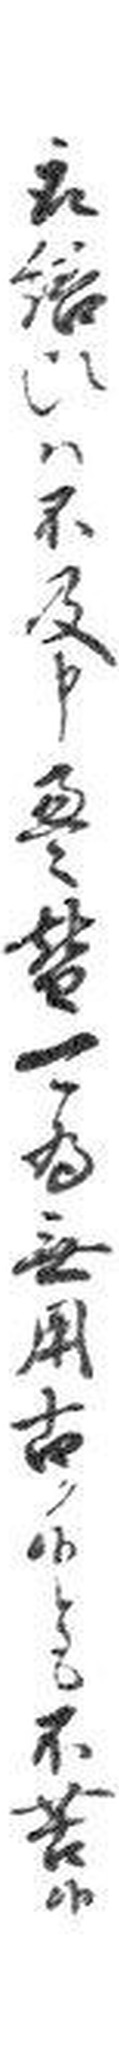取繕ひハ不及申畳替可為無用古ク候とも不苦候
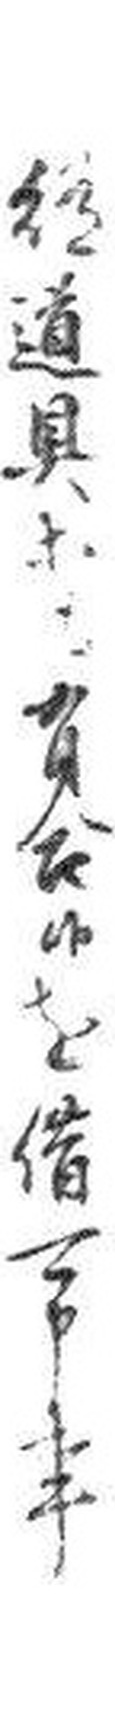繕道具等も有合候を借可申事
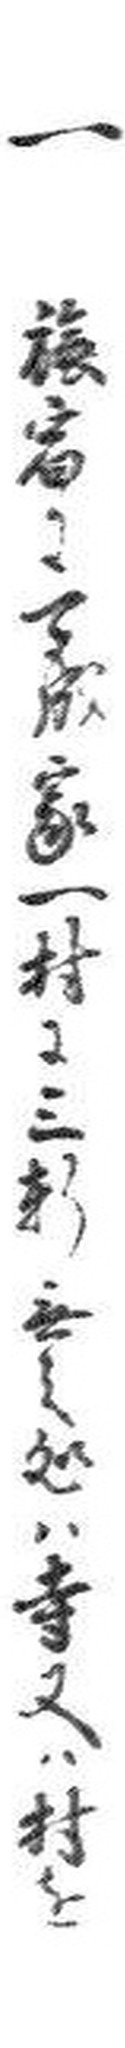一旅宿に可成家一村に三軒無之処ハ寺又ハ村を
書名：家譜 二十九 吉邦公 従正徳二年到正徳三年
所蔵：福井県文書館 Fukui Prefectural Archives
